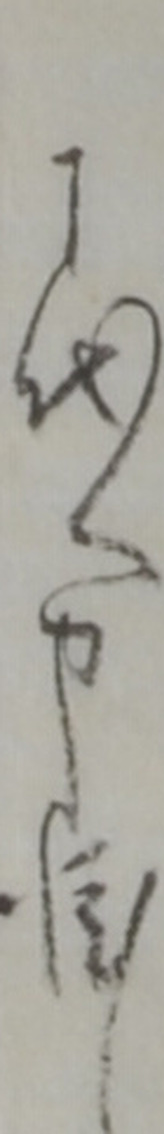丁代へ申渡候

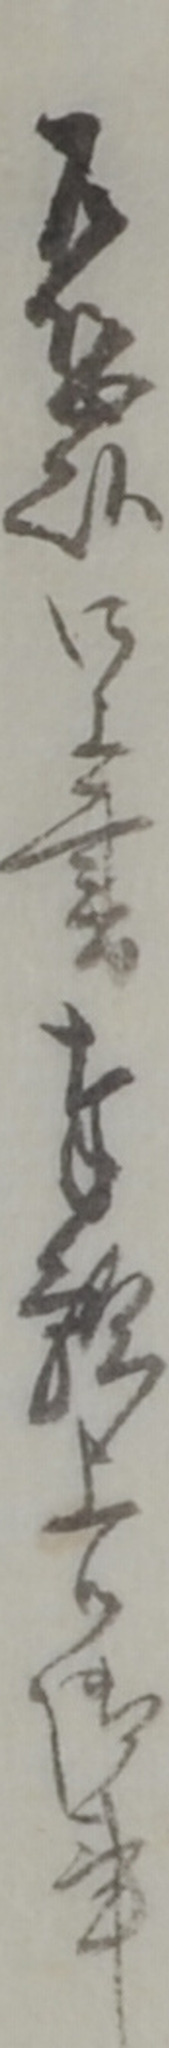乍恐以口上書奉願上候御事
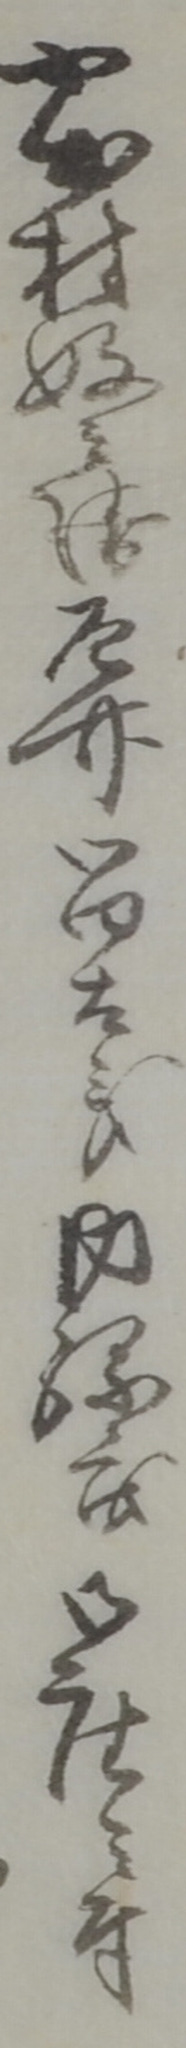小出村好兵衛厄介留太義内縁も御座候ニ付
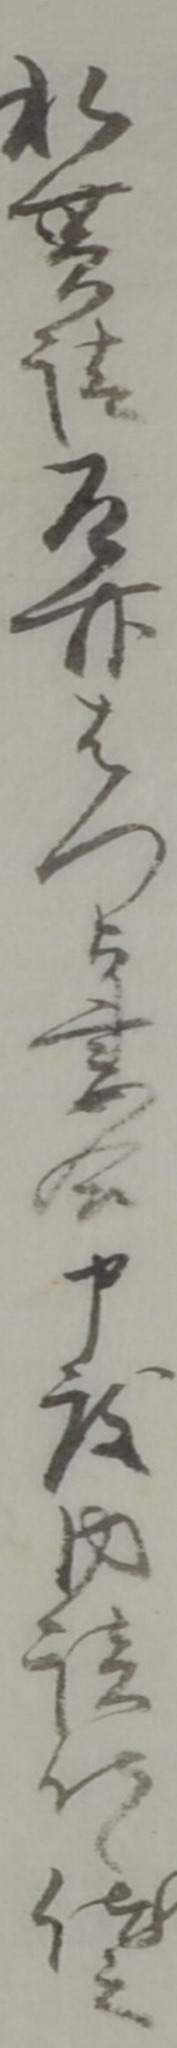私貰請厄介はつと妻合申度内談仕候依之
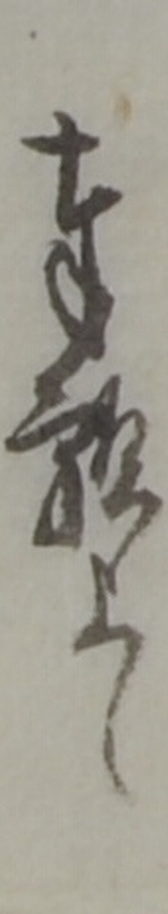奉願上候
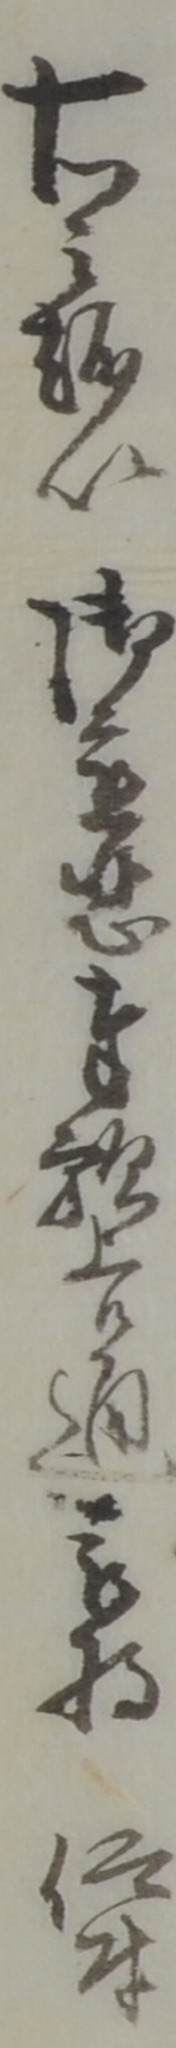右之趣以御慈悲奉願上候通被為仰付
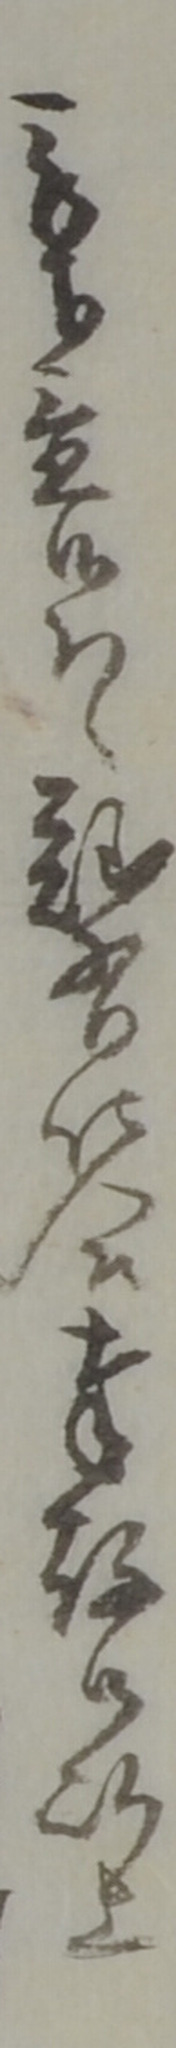被下置候ハヽ難有仕合奉存候以上
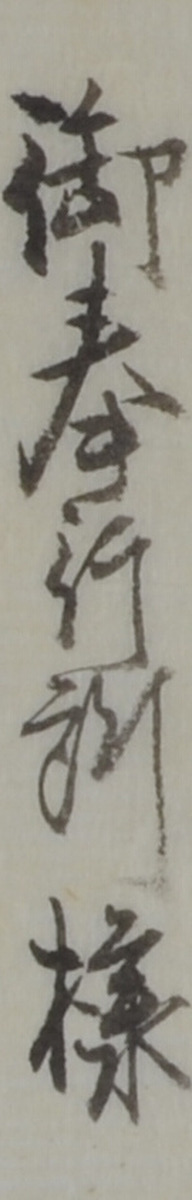御奉行所様
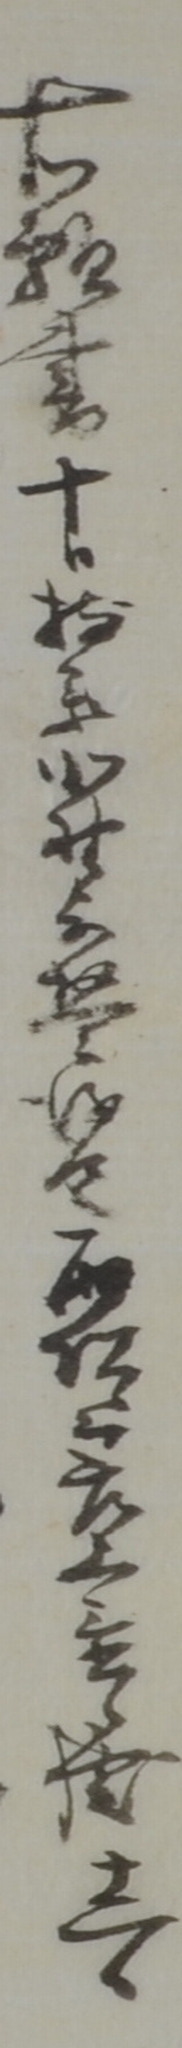右願書十日持参北野与惣兵衛殿取次ニ而差上置候處十二日
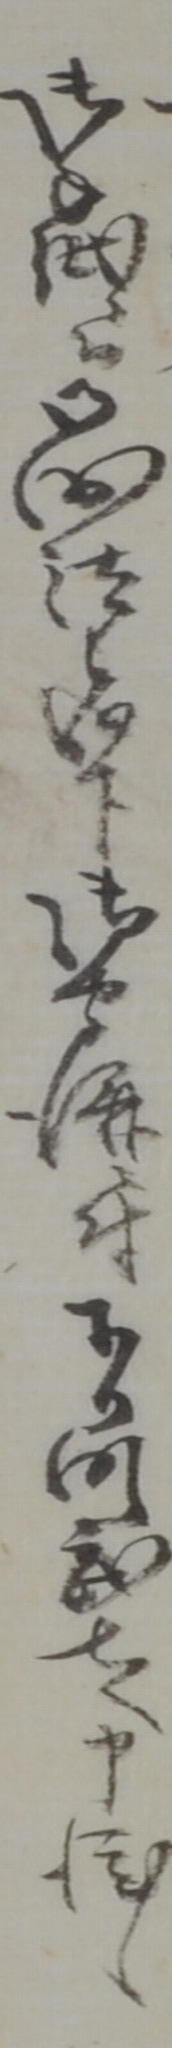御手紙ニ而御沙汰被成下御聞済ニ付下り町武七へ申渡候
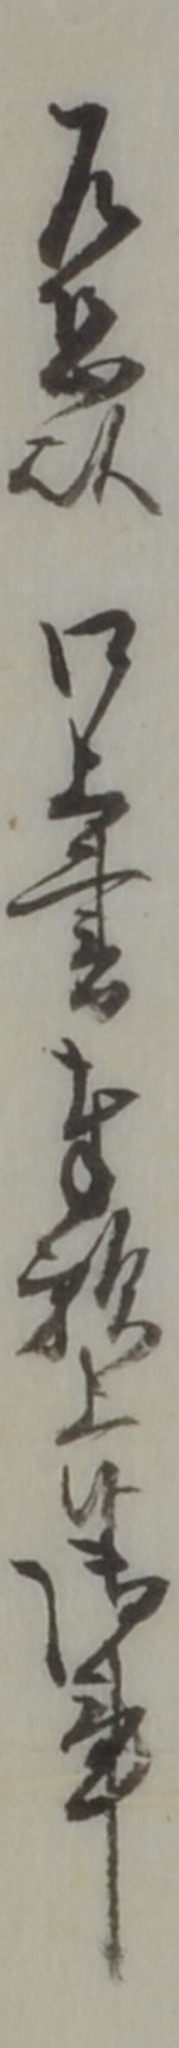乍恐以口上書奉願上候御事
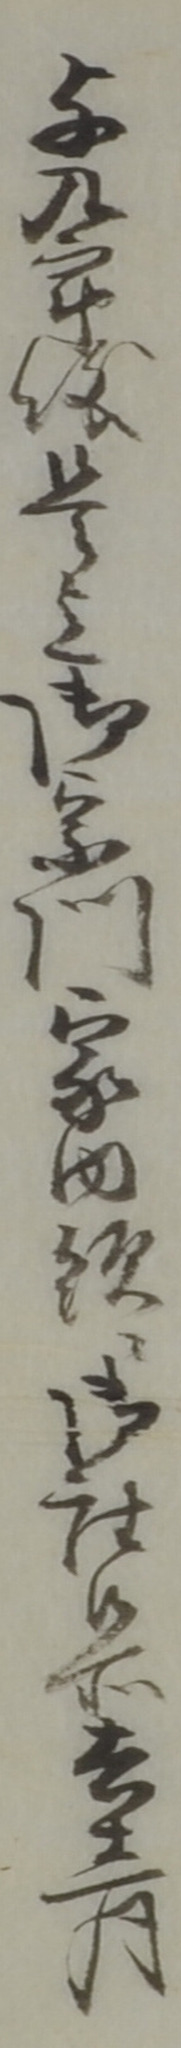与九郎儀是迄御宗門家内預ニ御座候所去十二月
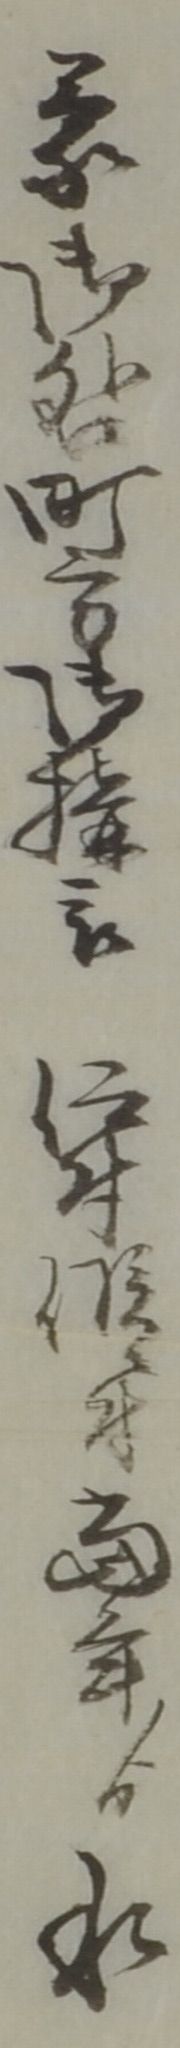蒙御咎町方御構被仰付候ニ付当年ゟ私
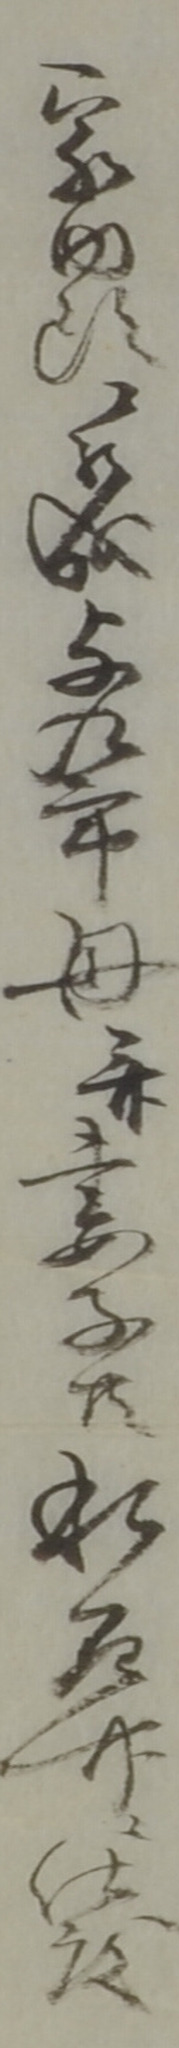家内頭ニ罷成与九郎母幷妻子共私厄介ニ仕度
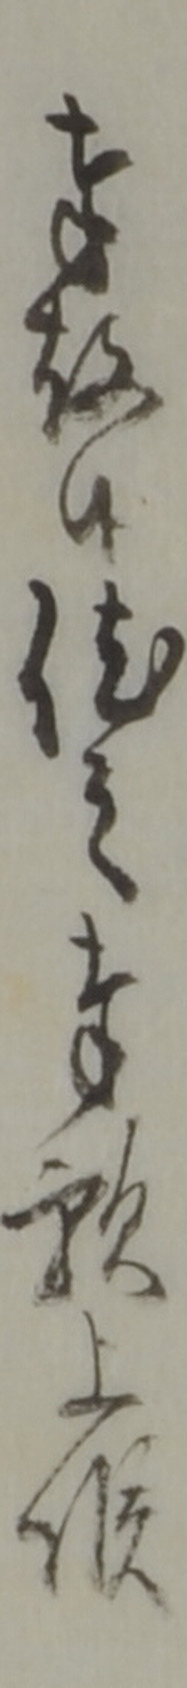奉存候依之奉願上候
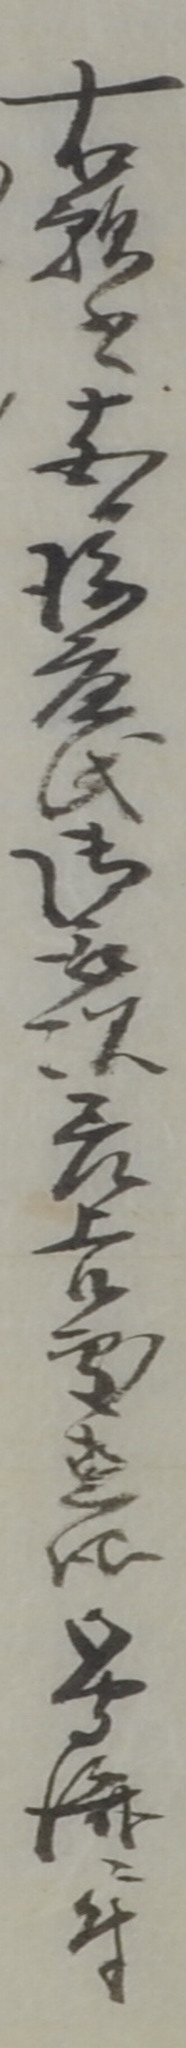右願書十五日後藤氏御取次差上候處直様御聞済ニ付
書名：諸願書控簿
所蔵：伊那市立高遠町図書館・合同会社AMANE
